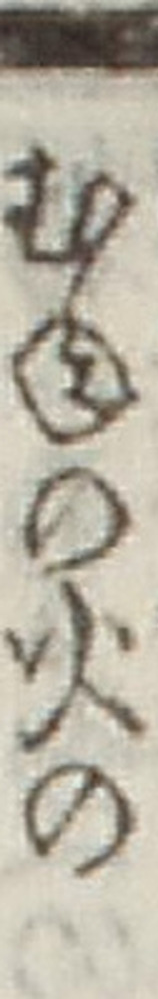むねの火の
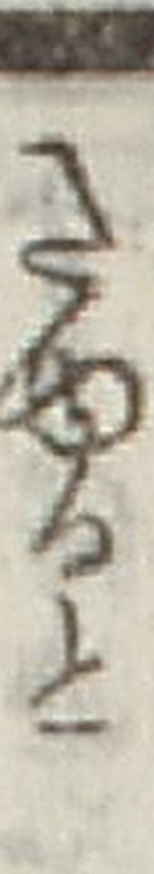たゆると
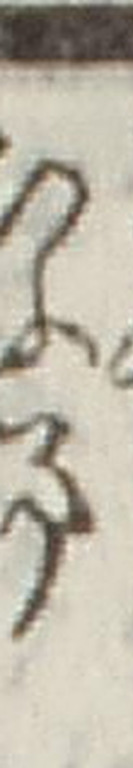いふ事
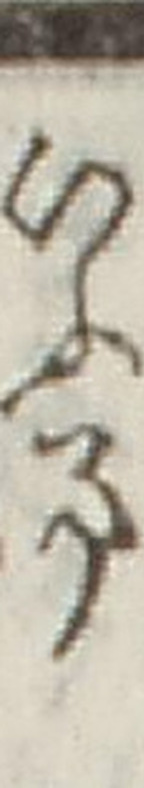いふ事
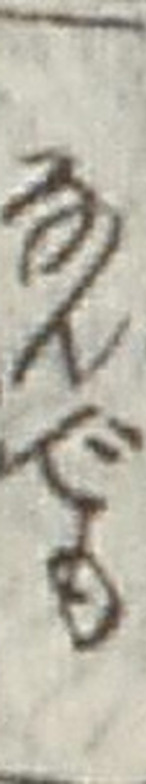なんでも
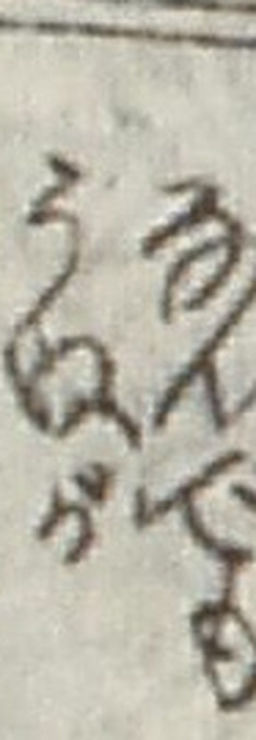うぬが
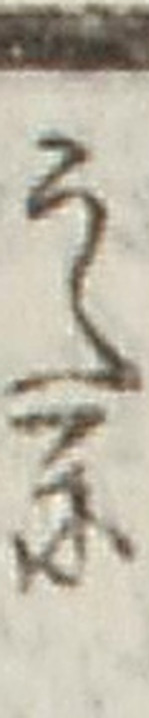うたに
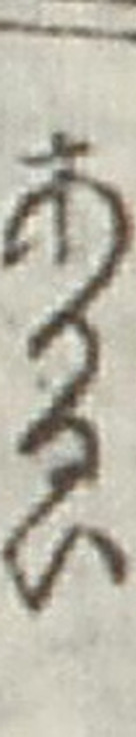あかるい
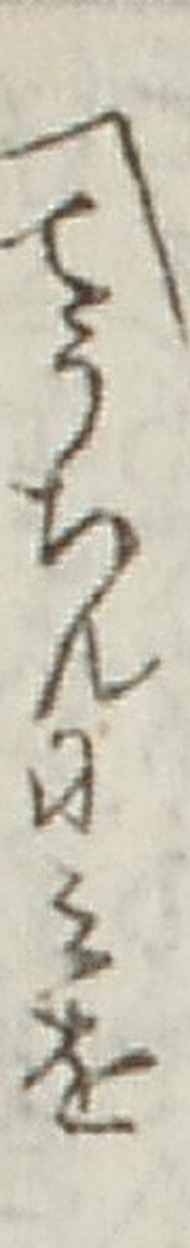〽てうちんに？みを
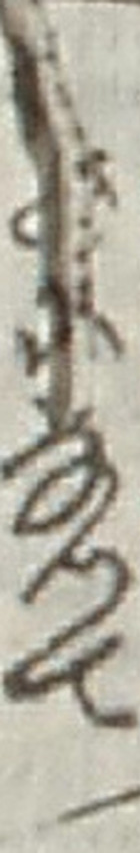なつて
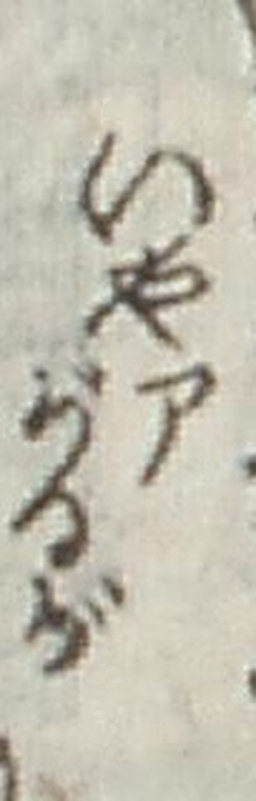がるが
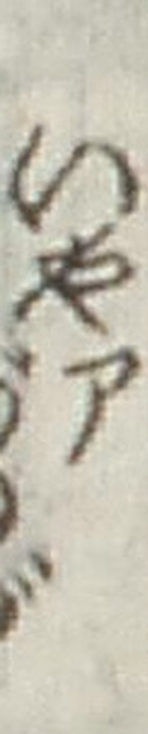いやァ
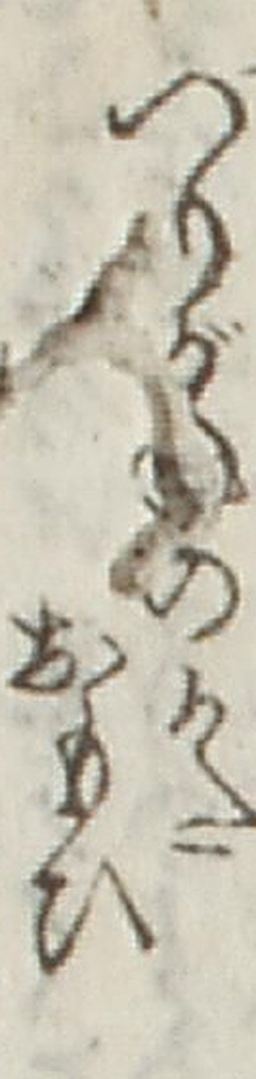おもひ
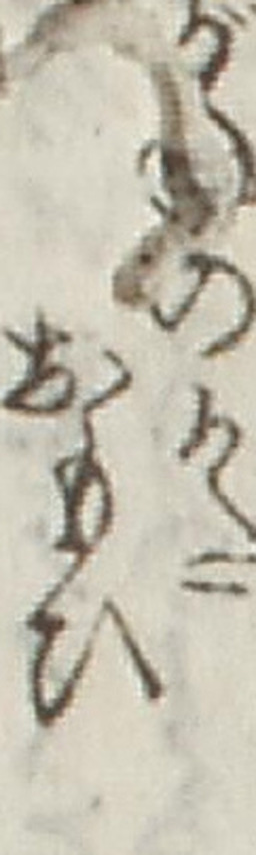おもひ
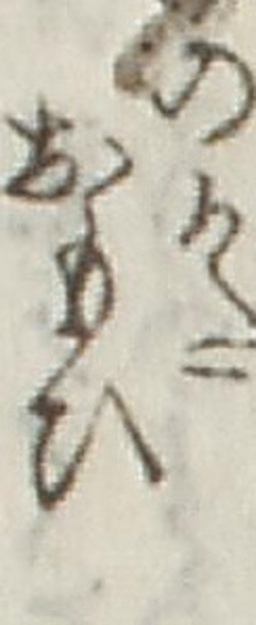おもひ
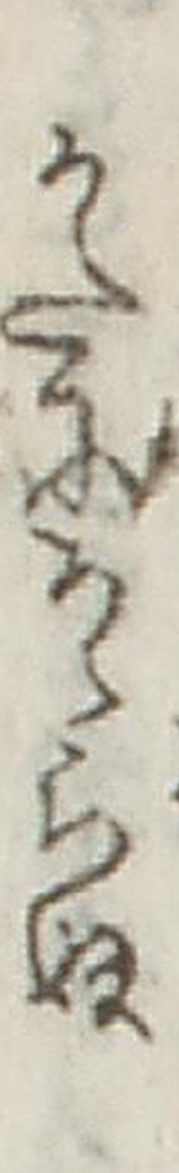かたにかゝらぬ
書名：三世相出雲當座帳　上下冊
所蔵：東京大学地震研究所図書室 Earthquake Research Institute Library, The University of Tokyo, JAPAN
